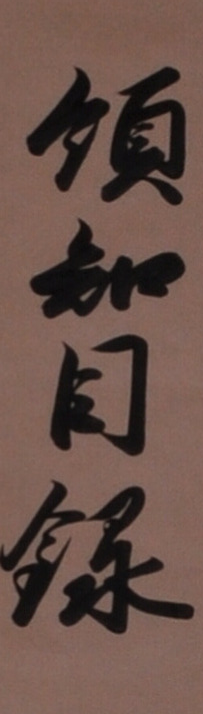領知目録

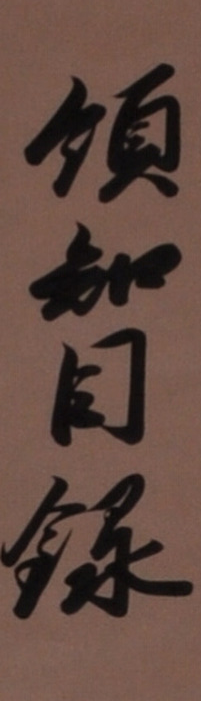領知目録

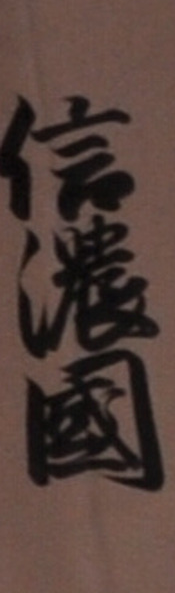信濃国
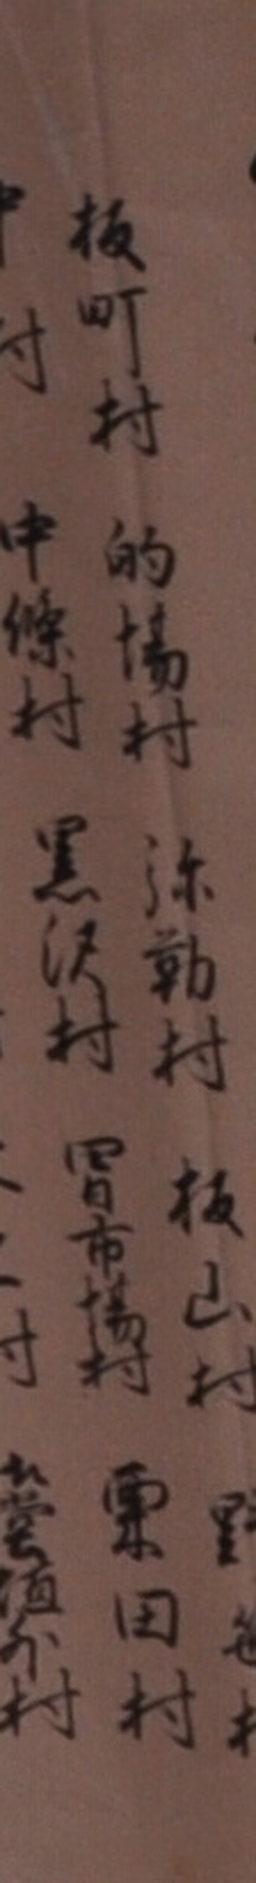中村中条村黒沢村四日市場村栗田村
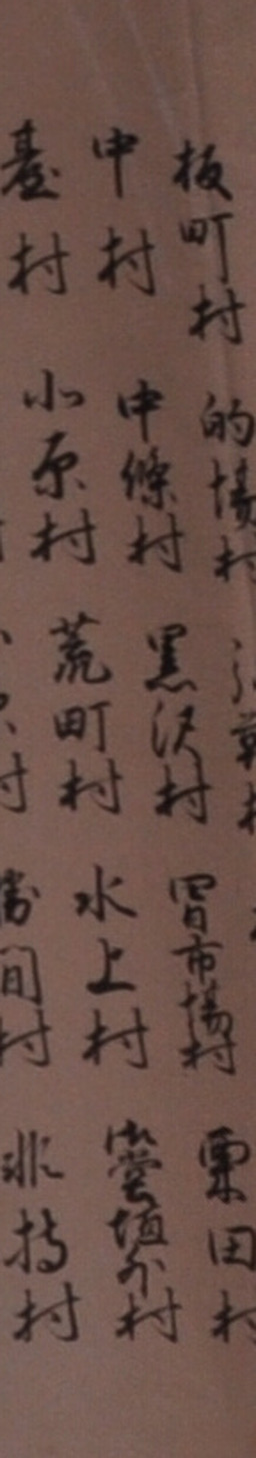台村北原村荒町村水上村御堂垣外村
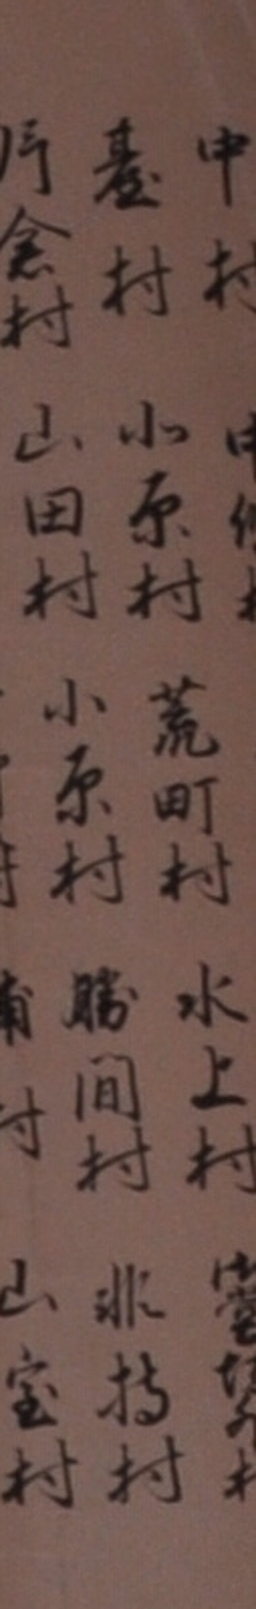片倉村山田村小原村勝間村非持村
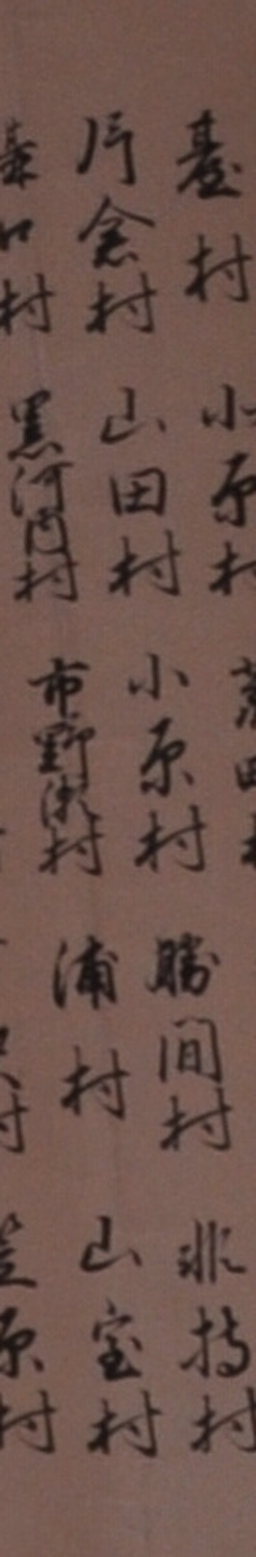溝口村黒河内村市野瀬村浦村山室村
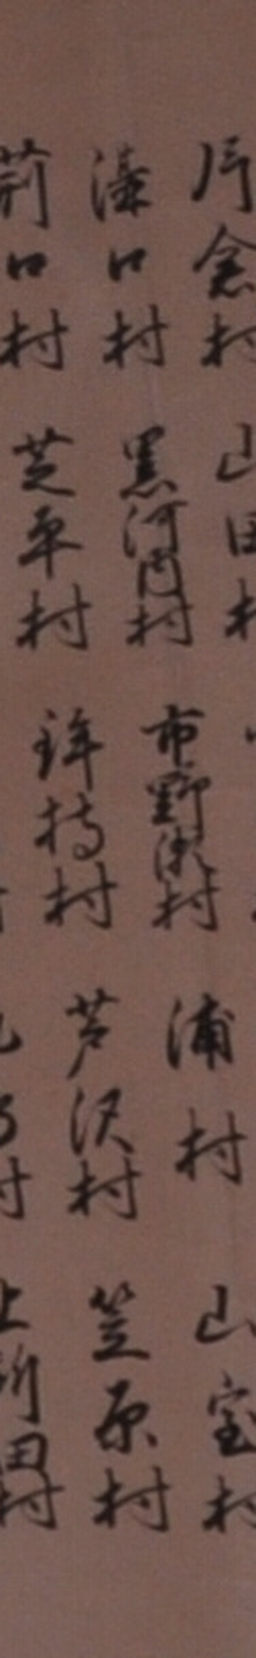荊口村芝平村鉾持村芦沢村笠原村
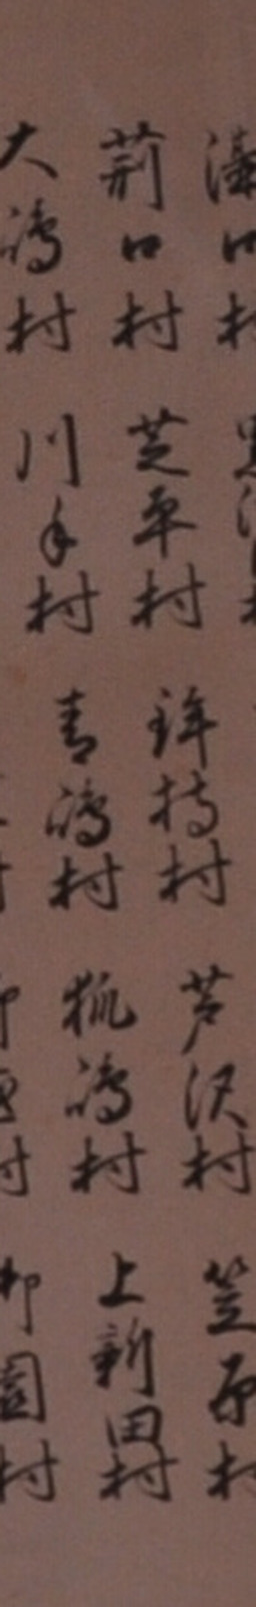大島村川手村青島村狐島村上新田村
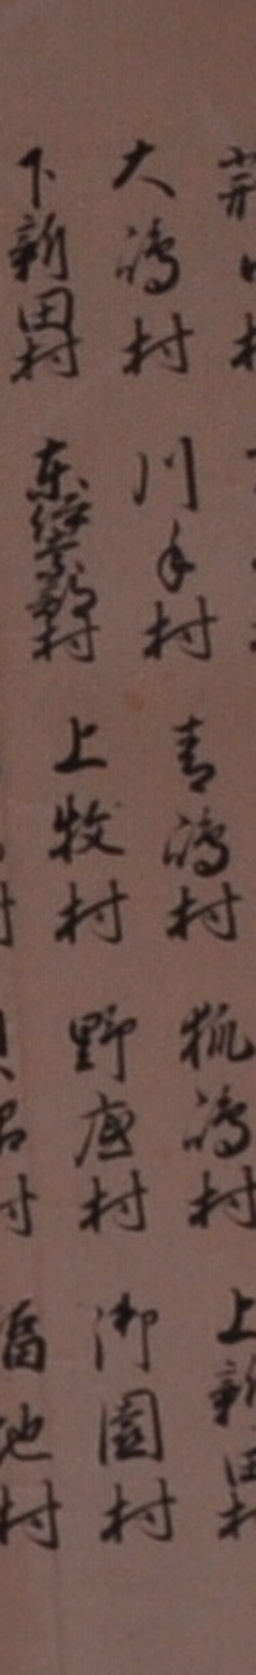下新田村東伊奈部村上牧村野底村御園村
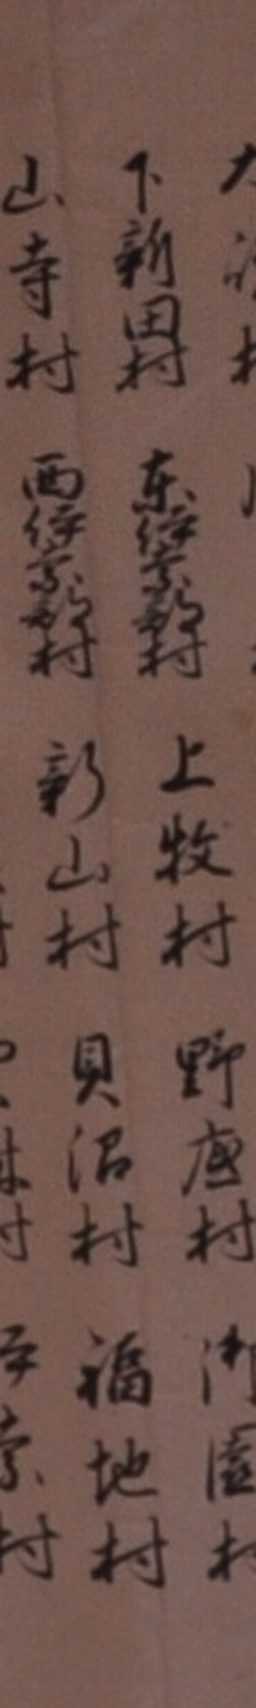山寺村西伊奈部村新山村貝沼村福地村
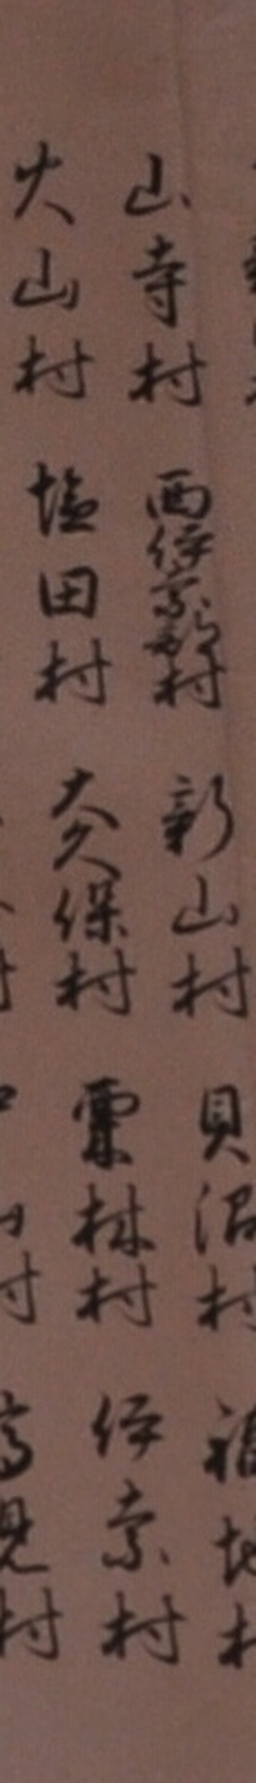火山村塩田村大久保村栗林村伊奈村
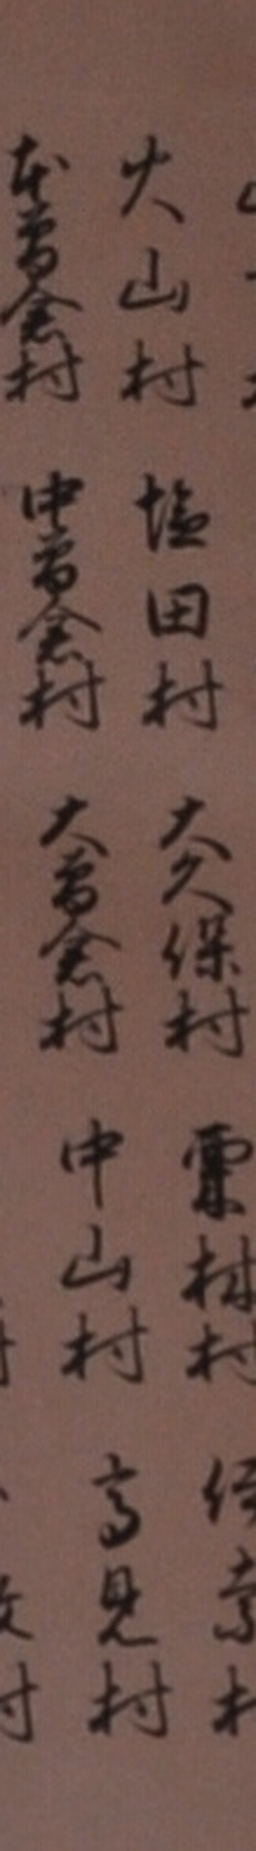本曽倉村中曽倉村大曽倉村中山村高見村
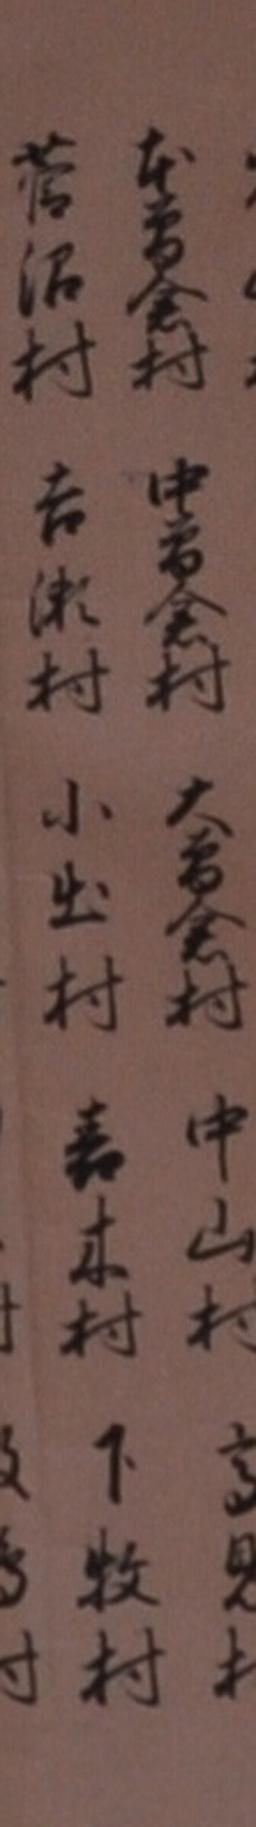菅沼村吉瀬村小出村表木村下牧村
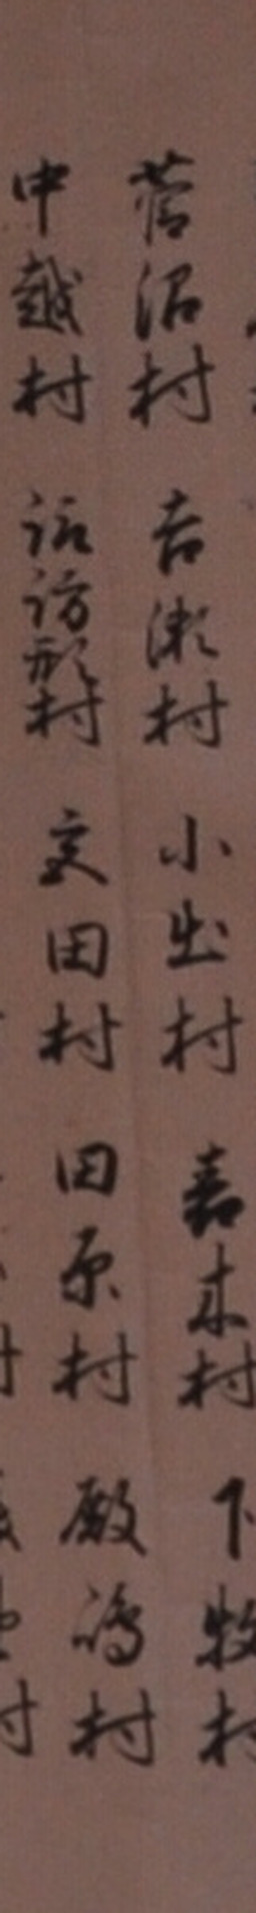中越村諏訪形村宮田村田原村殿島村
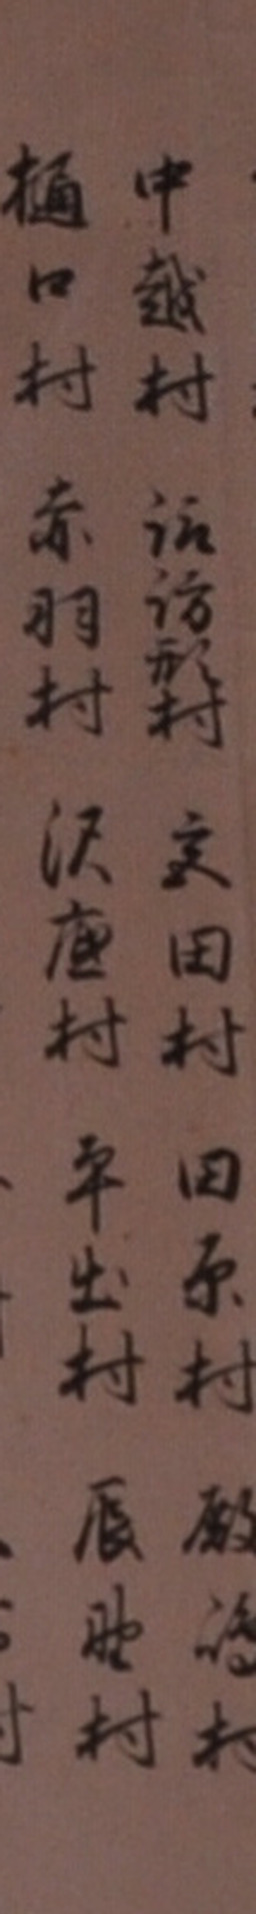樋口村赤羽村沢底村平出村辰野村
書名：御朱印写・領地目録
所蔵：伊那市立高遠町図書館・合同会社AMANE
